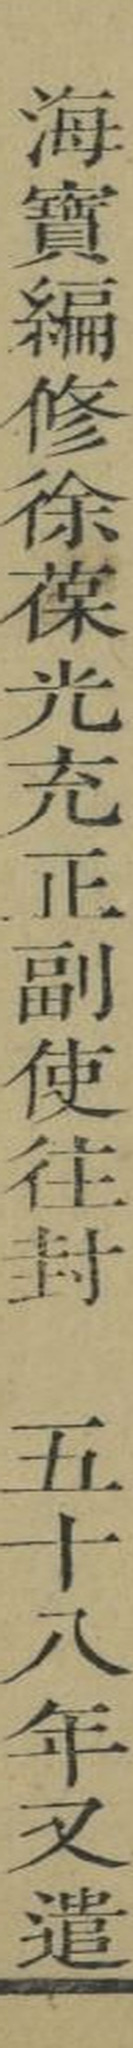海宝編修徐葆光充正副使往封五十八年又遣
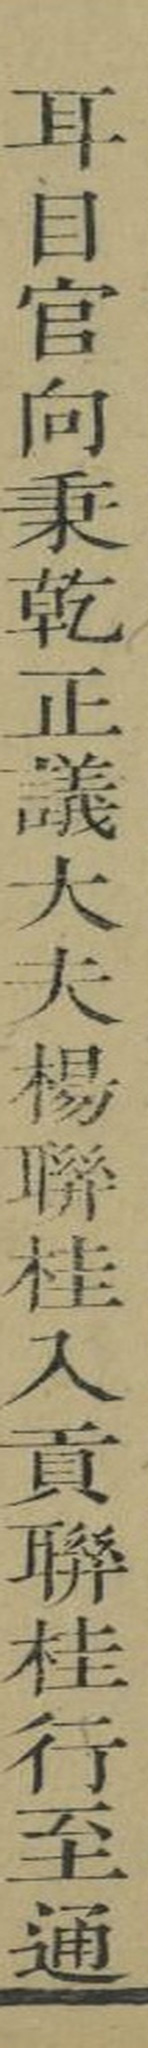耳目官向秉乾正議大夫楊聯桂入貢聯桂行至通
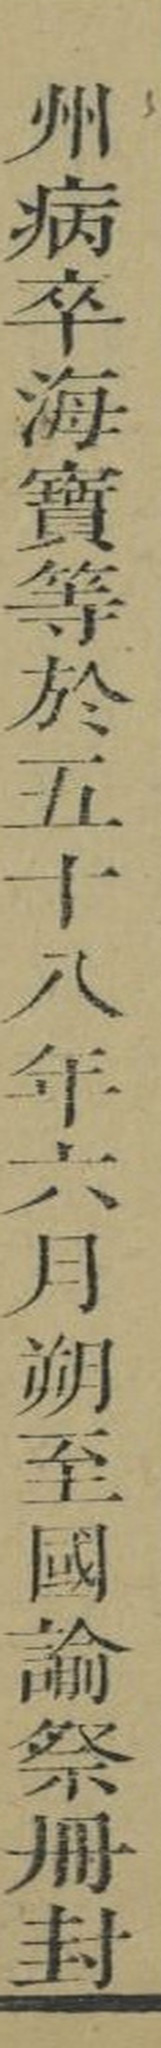州病卒海宝等於五十八年六月朔至国諭祭冊封
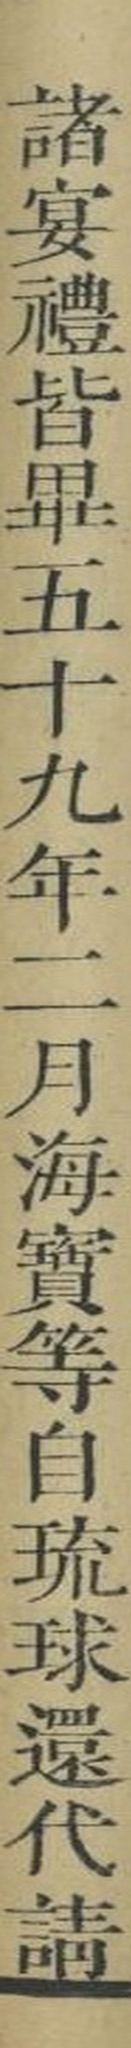諸宴礼皆畢五十九年二月海宝等自琉球還代請
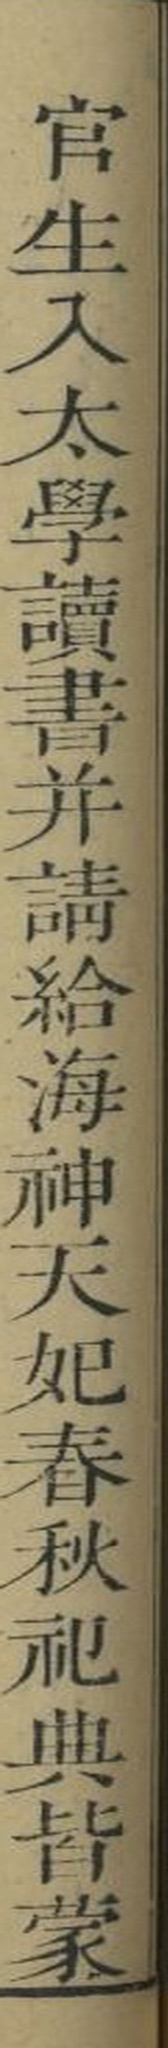官生入太学読書并請給海神天妃春秋祀典皆蒙
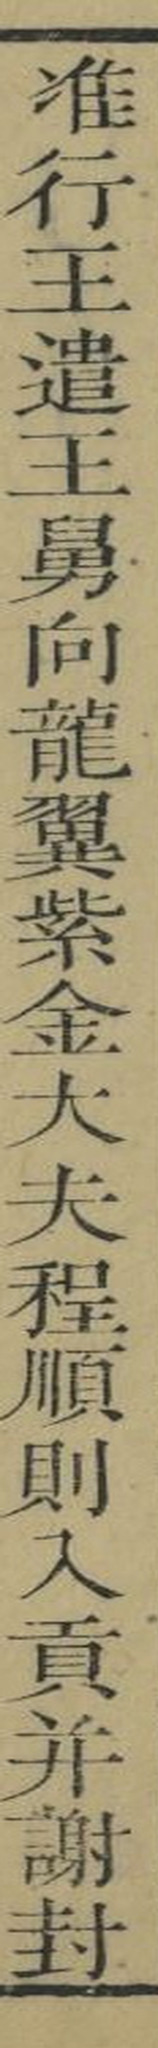准行王遣王舅向竜翼紫金大夫程順則入貢并謝封
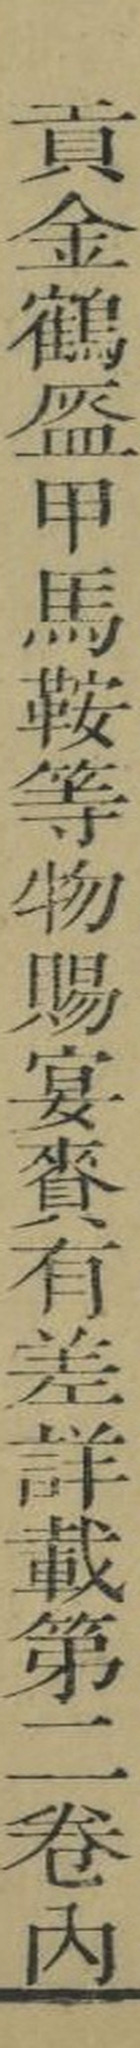貢金鶴盔甲馬鞍等物賜宴賚有差詳載第二巻内

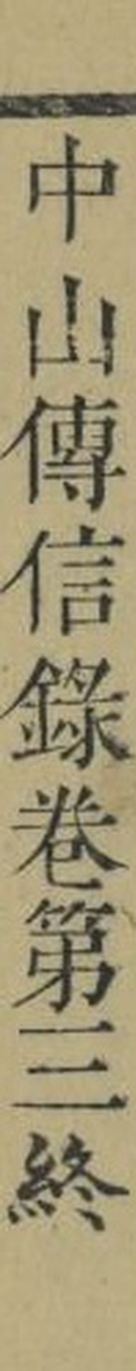中山伝信録巻第三終
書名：中山伝信録 巻三
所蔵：University of the Ryukyus Library
